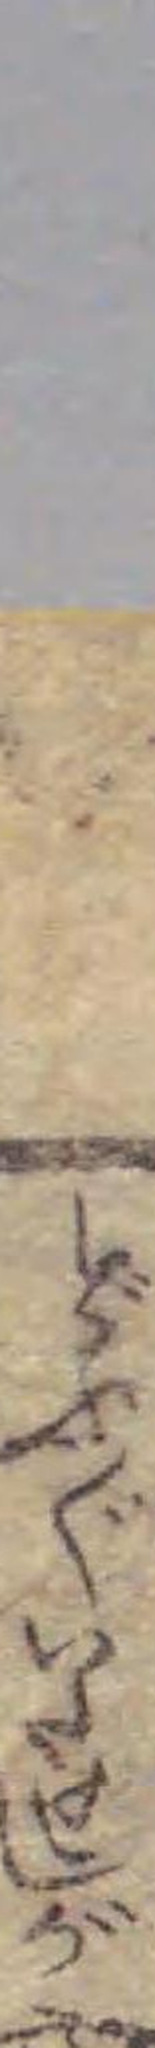どふ〴〵いたせしが
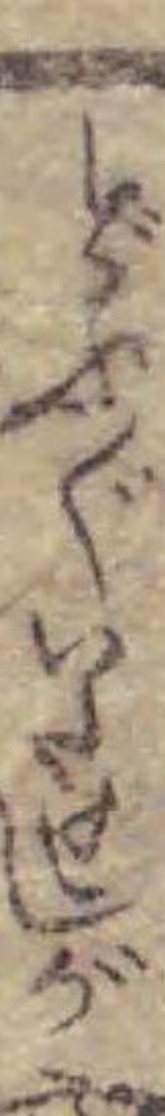どふ〴〵いたせしが
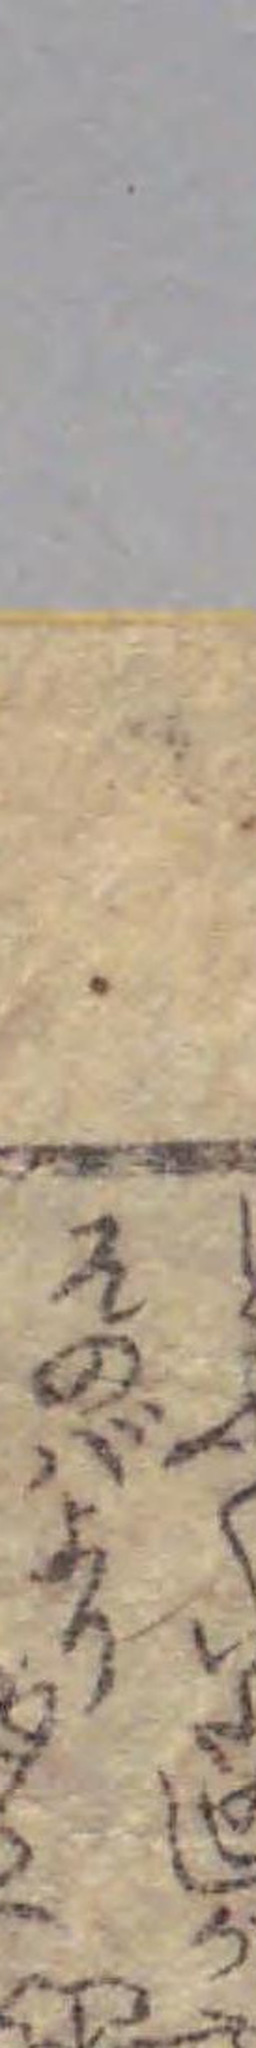そのばよりゆくへ
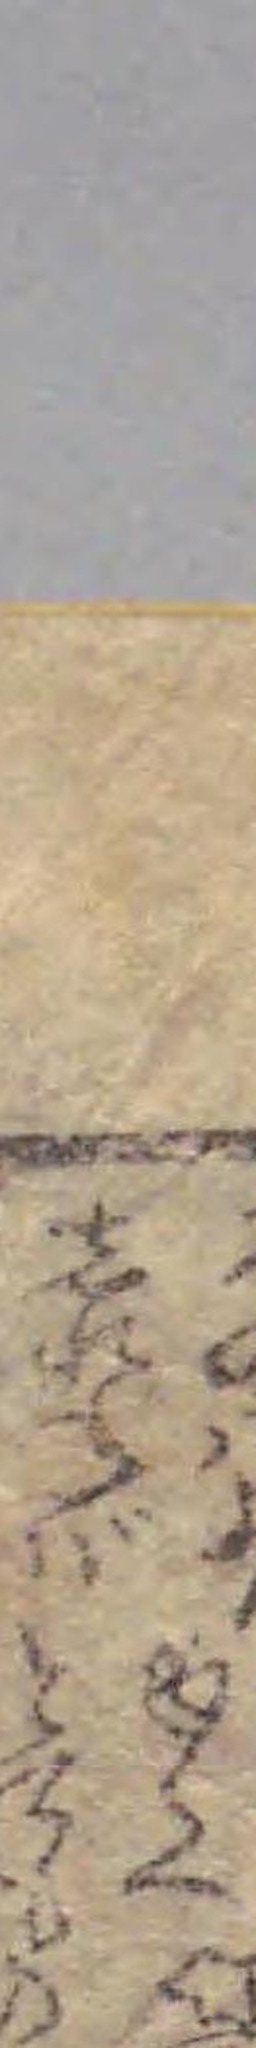しれねばとてもの
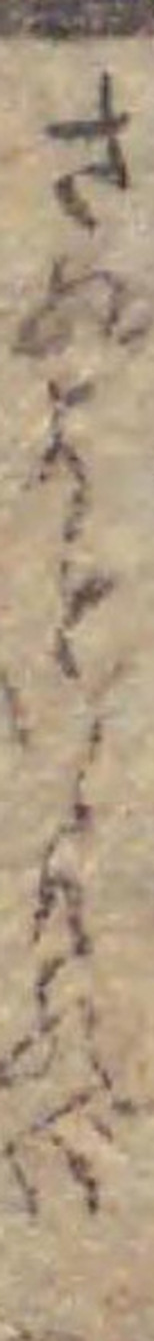されよといゝければ
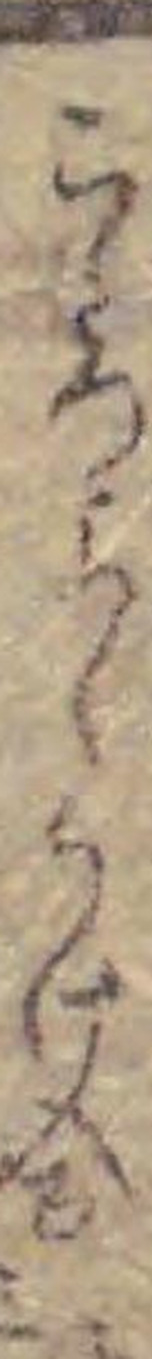こゝろよくかけ合
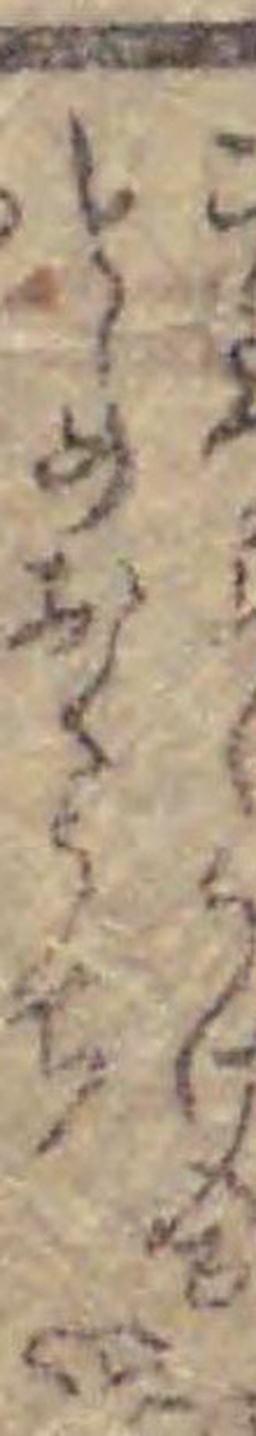とゝめおくうち
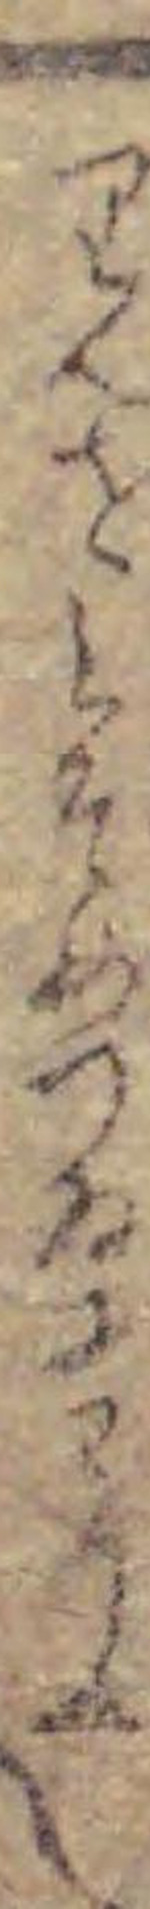りんをみそめつゐにわり▲

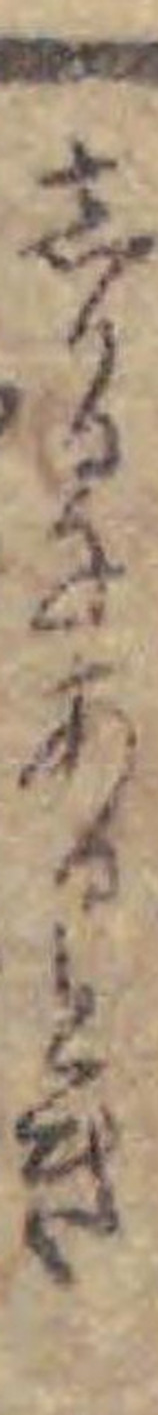しかるにあるとき
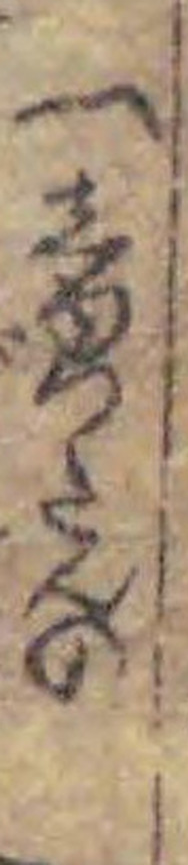〽しゆつたんの
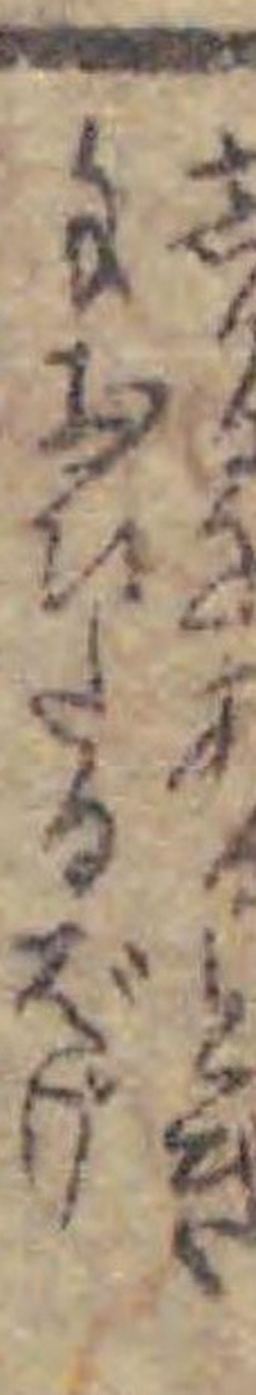手おひたるばけ
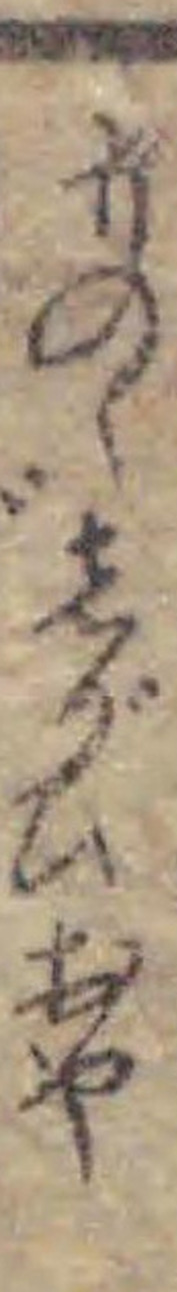ものゝしがひおや
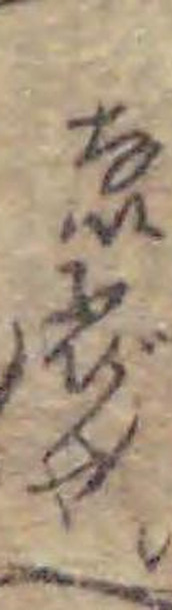ないふびんや
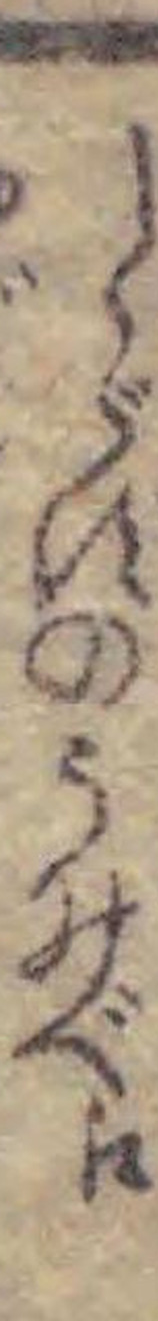しらずのうみべえ
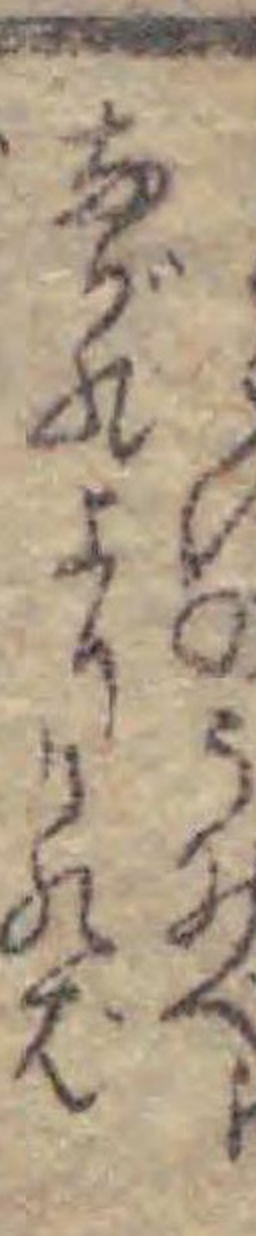ながれよりければ
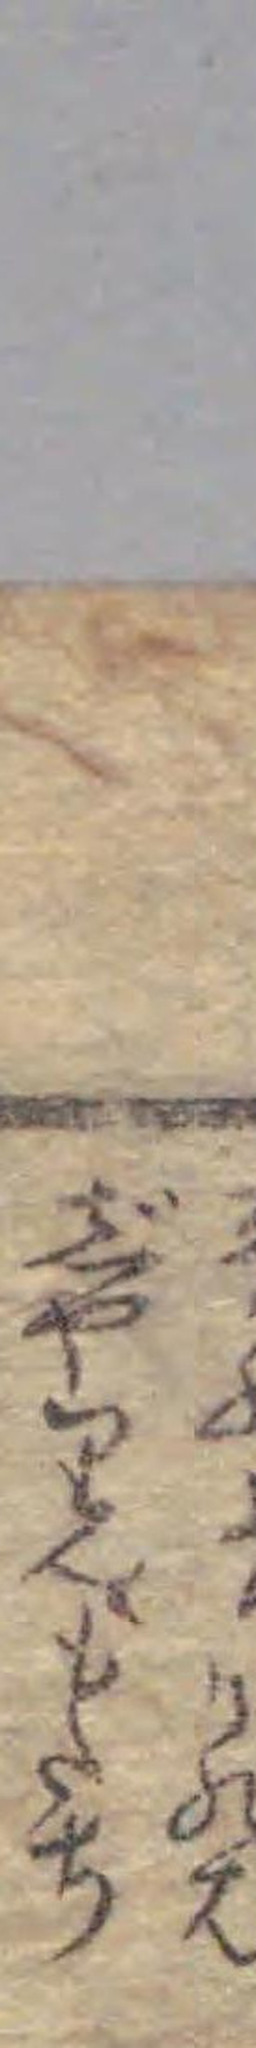じやりんもたち
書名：化物世界夜半嵐 : 3巻
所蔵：国立国会図書館 National Diet Library, JAPAN
